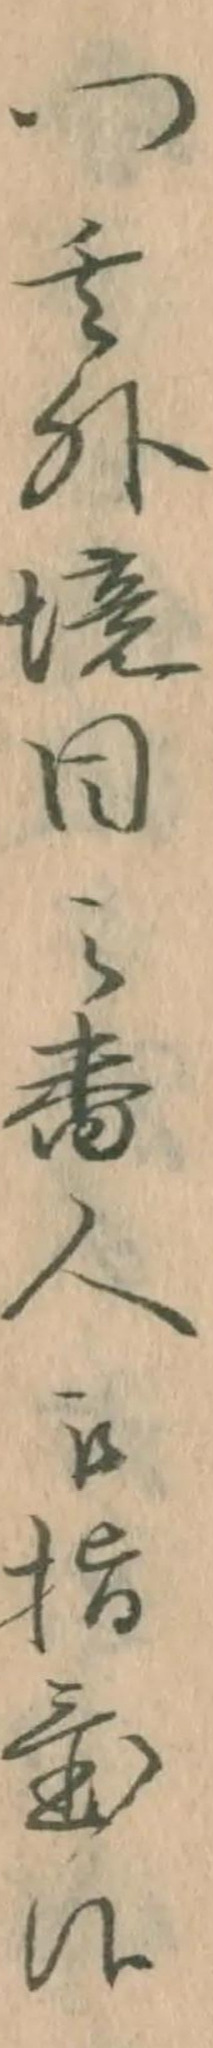門其外境目之番人被指置候
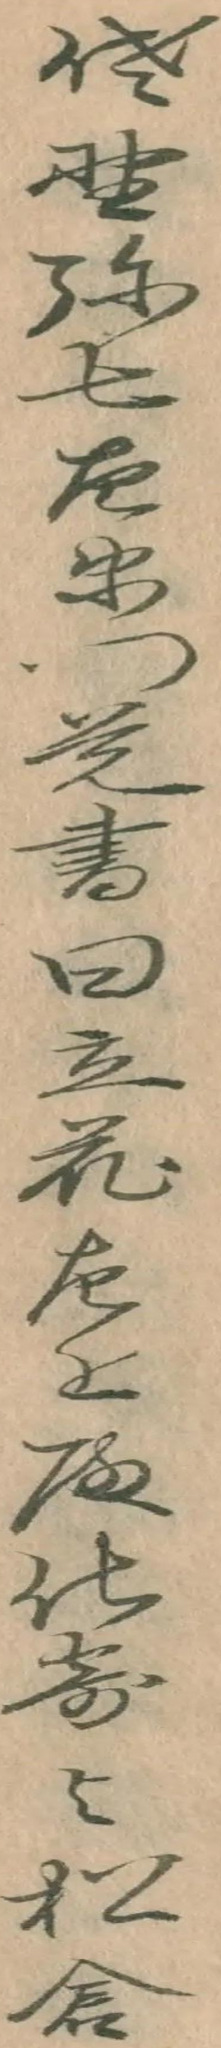佐野弥七左衛門覚書曰立花左近殿仕寄与松倉
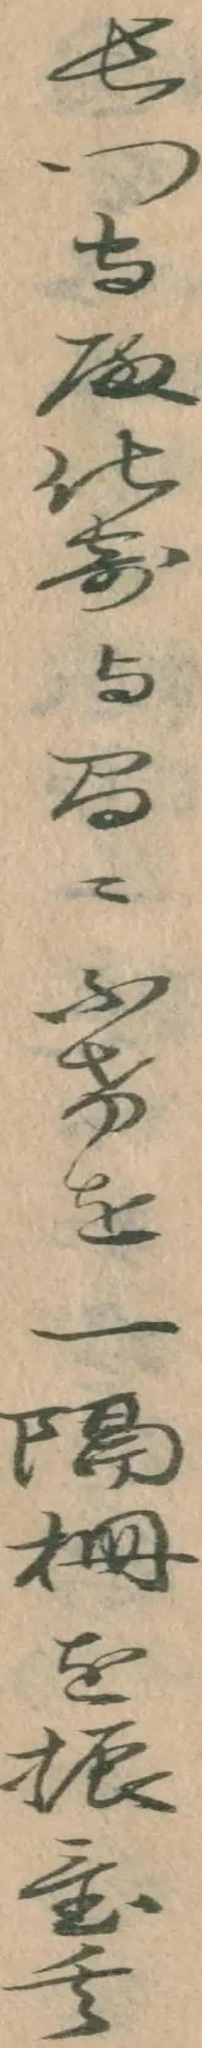長門守殿仕寄与間にふ希を一隅柵を振置其
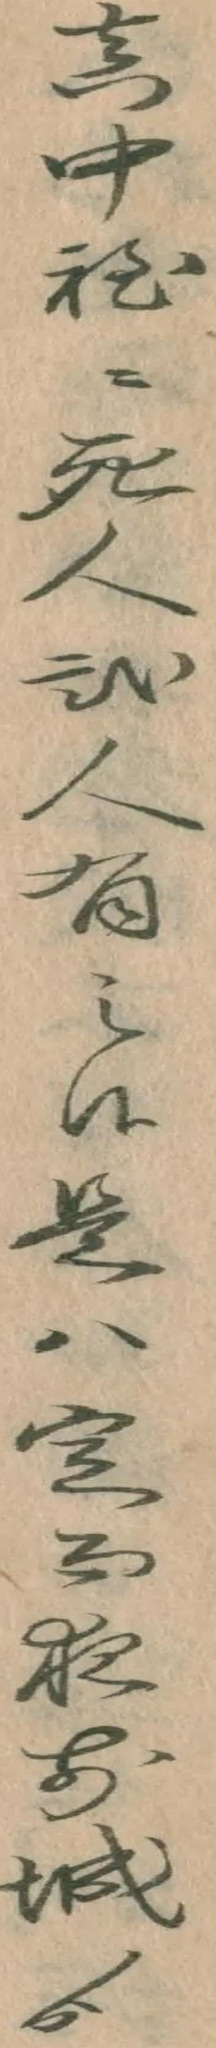真中程に死人弐人有之候是は定而夜前城ゟ
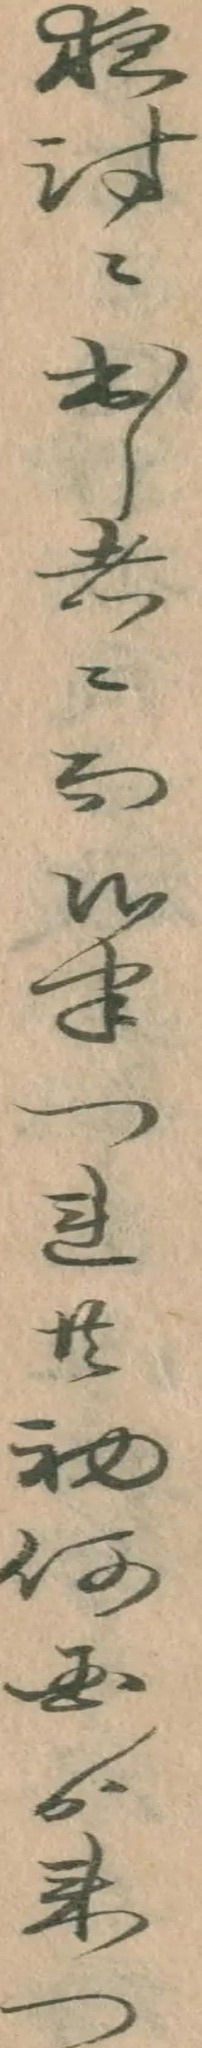夜討に出し者に而候半つ連共初何国ゟ来つ
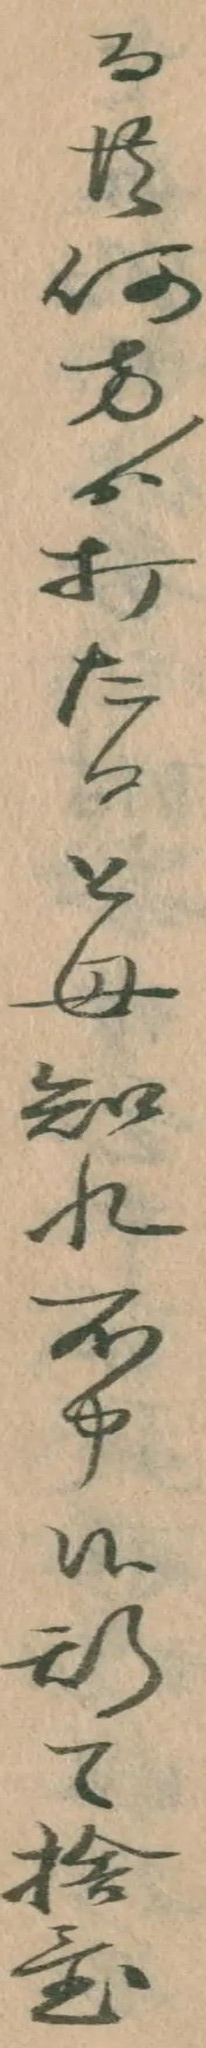る共何方ゟ打たると母知れ不申候斯て捨置
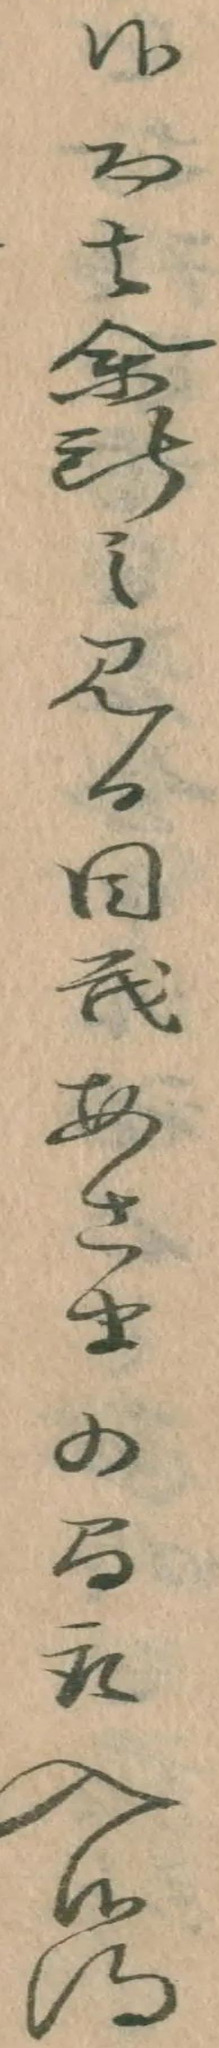候而者會所之見る目茂あさまの間取入候得
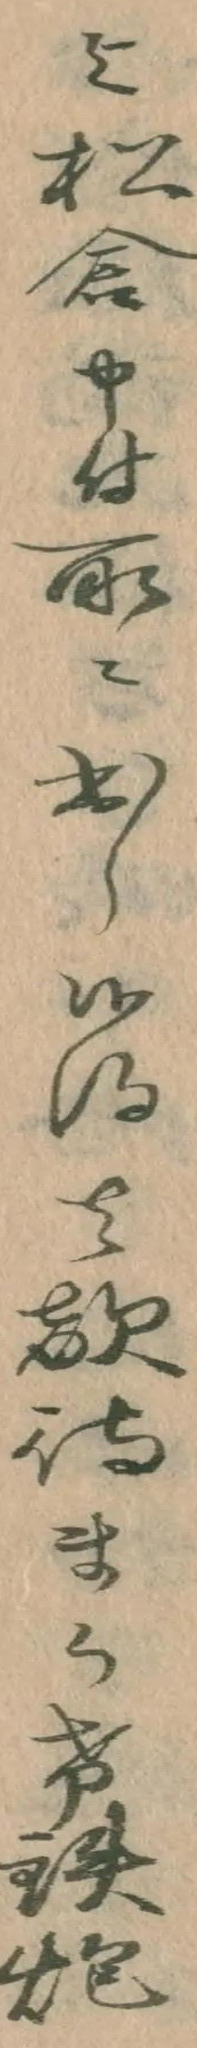与松倉申付取に出し候得者敵侍まう希鉄炮
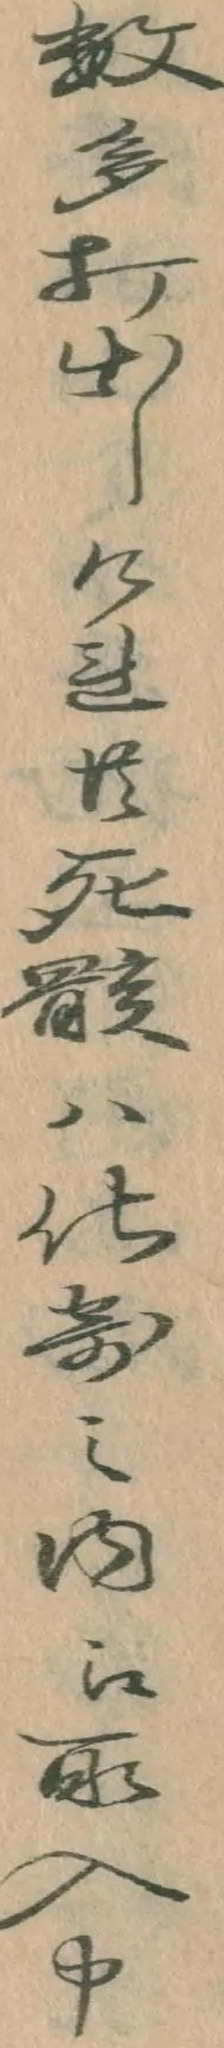数多打出しけ連共死骸は仕寄之内江取入申
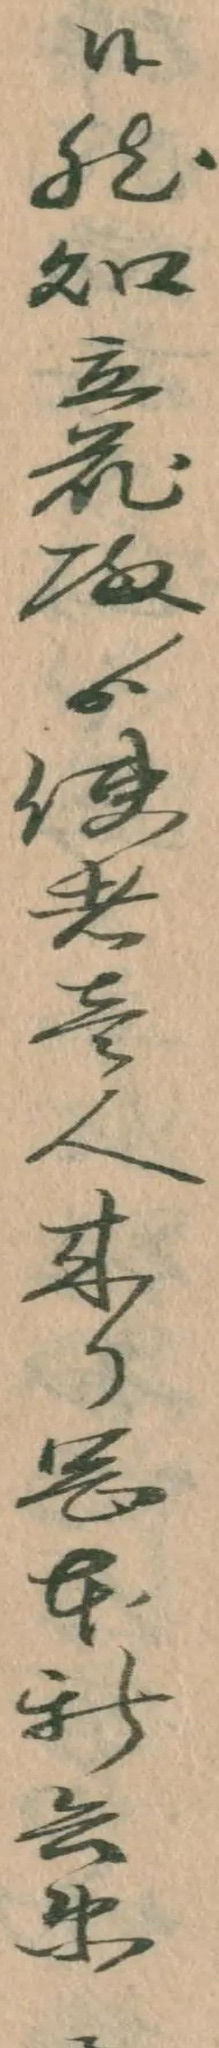候然処立花殿ゟ使者壱人来り岡本新兵衛に
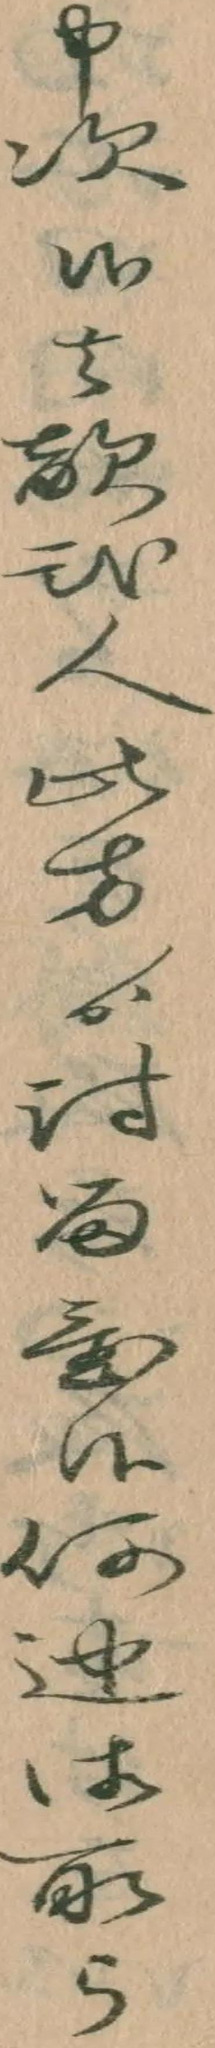申次候者敵弐人此方ゟ討留置候何迚御取ら
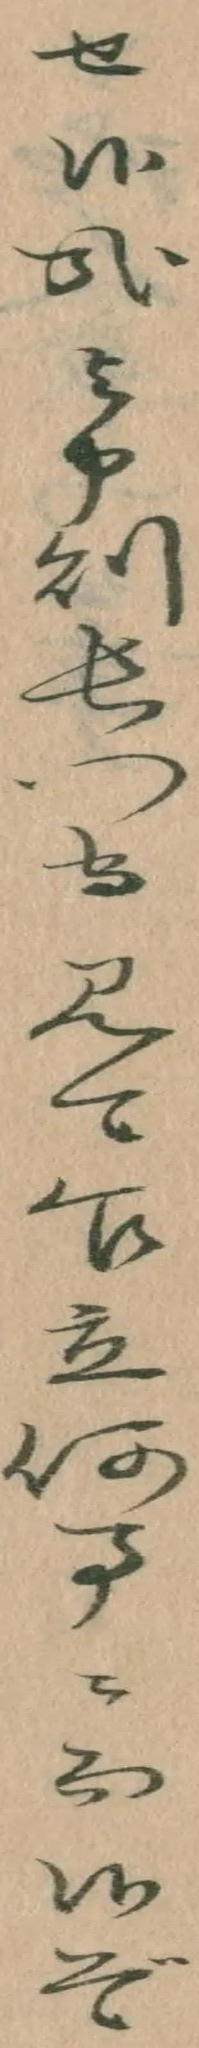せ候哉与申則長門守見て乍立何事に而候ぞ
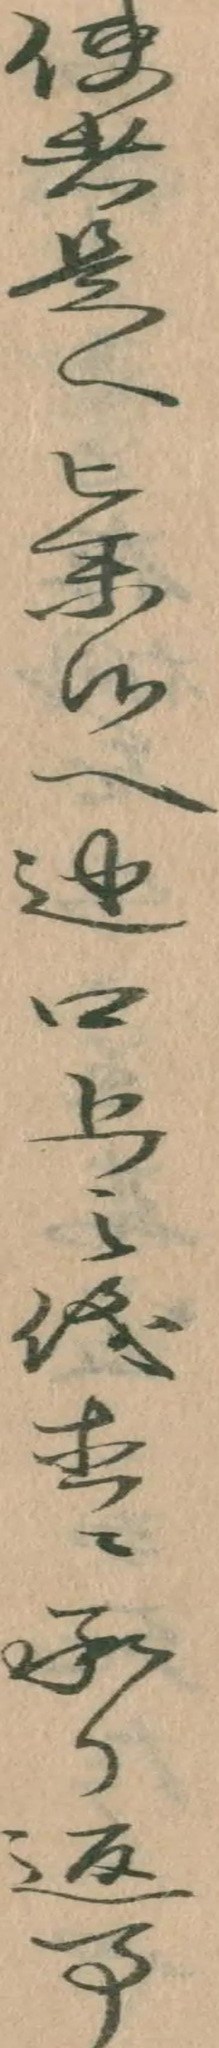使者是へ被参候へ迚口上之儀直に承り返事
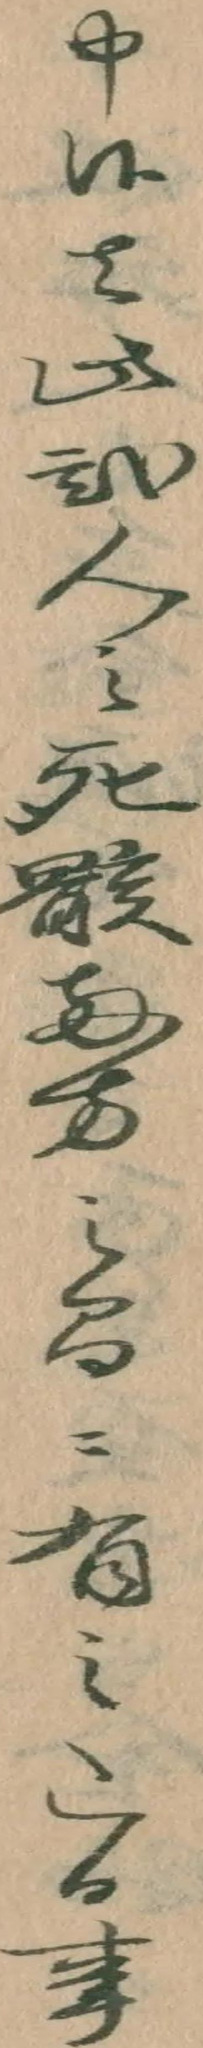申候者此弐人之死骸両方之間に有之たる事
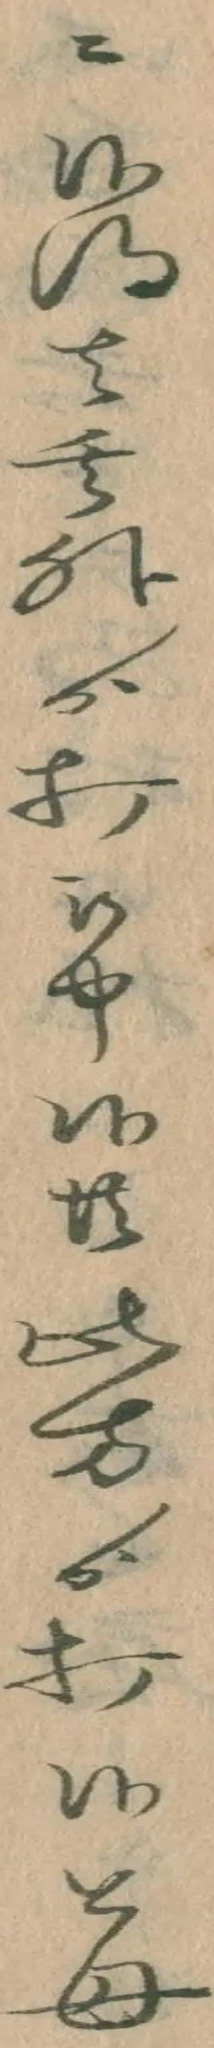に候得者其外ゟ打被申候共此方ゟ打候と母
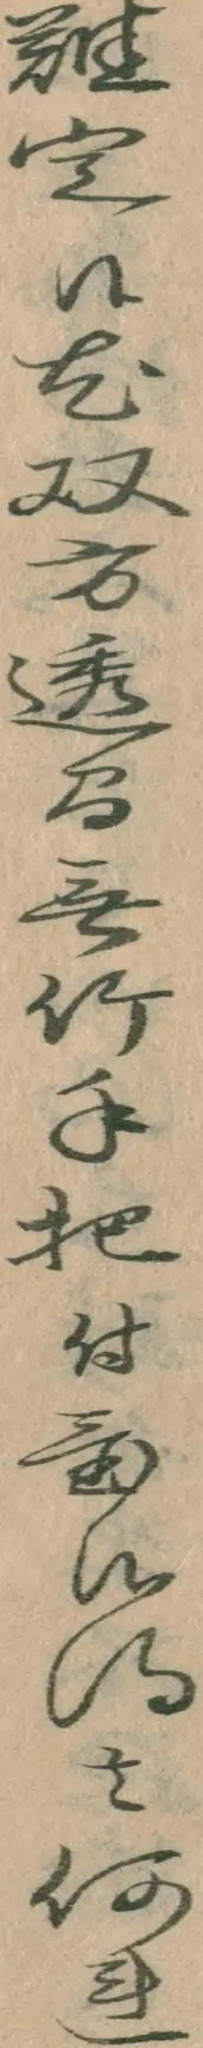難定候尤双方透間無竹手把付置候得者何連
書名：切支丹御退治記 49巻. [7]
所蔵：国立国会図書館 National Diet Library, JAPAN
